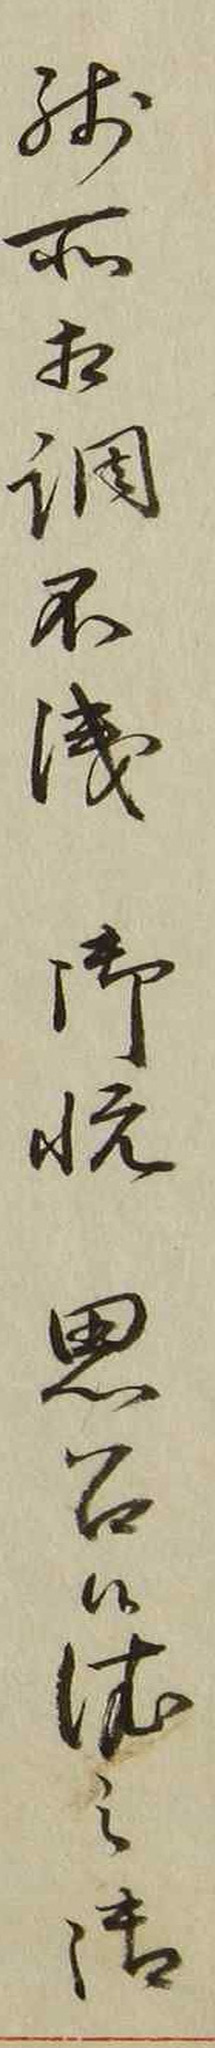残所相調不浅御悦思召候依之御
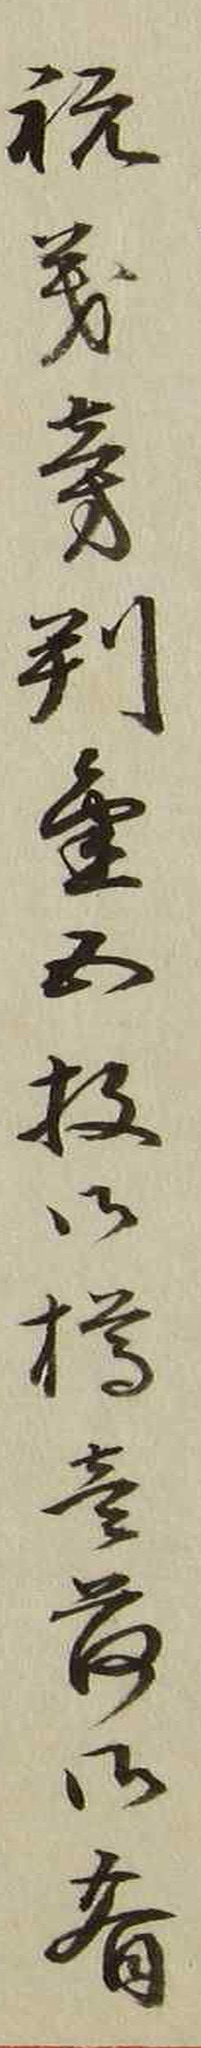祝儀旁判金五枚御樽壱荷御肴
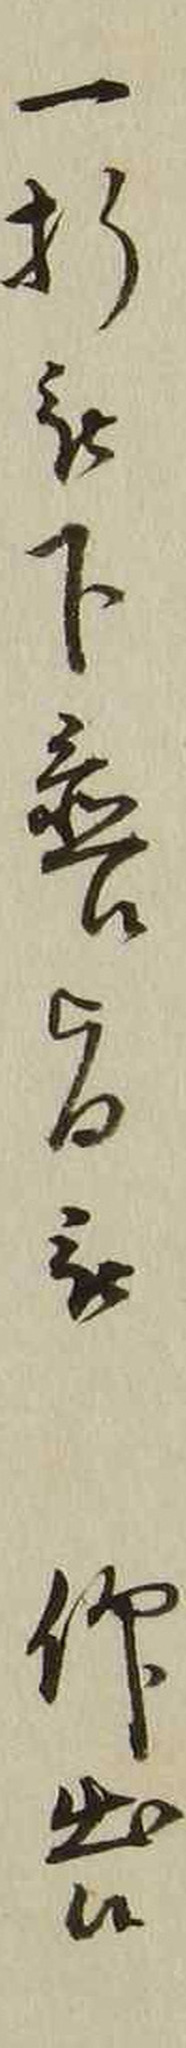一折被下置候旨被仰出候
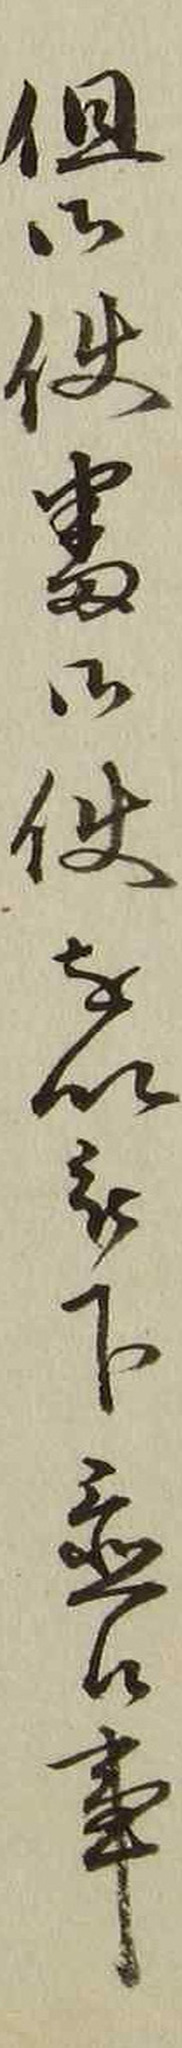但御使番御使を以被下置候事
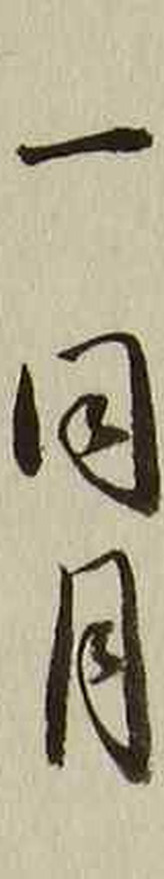一同月
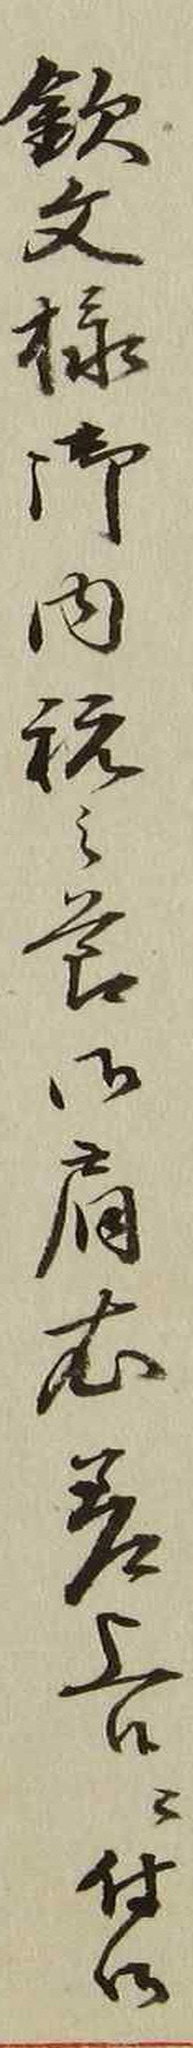欽文様御内祝之節御肩衣差上候に付御
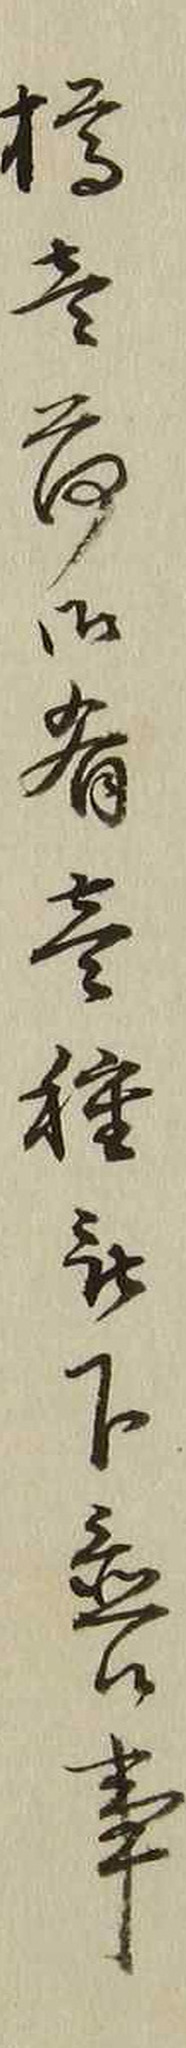樽壱荷御肴壱種被下置候事
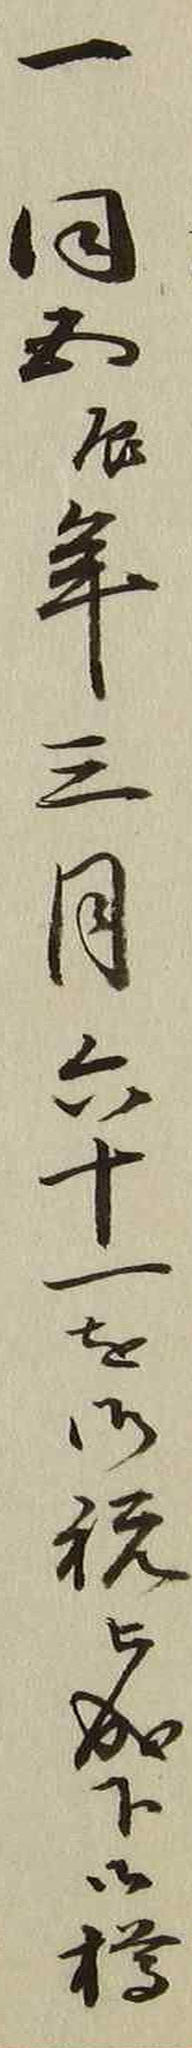一同五辰年三月六十一を御祝被成下御樽
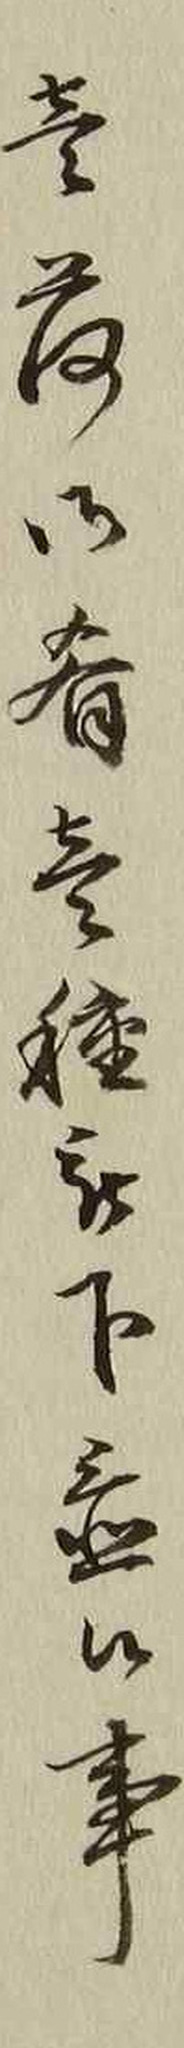壱荷御肴壱種被下置候事
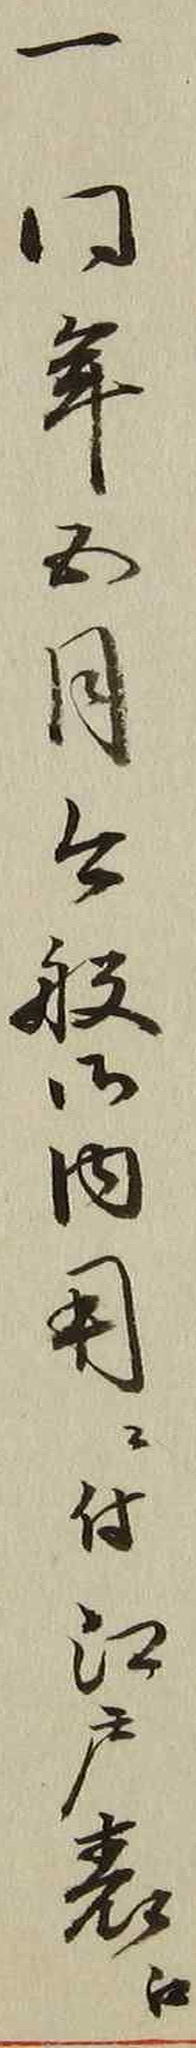一同年五月今般御内用に付江戸表江
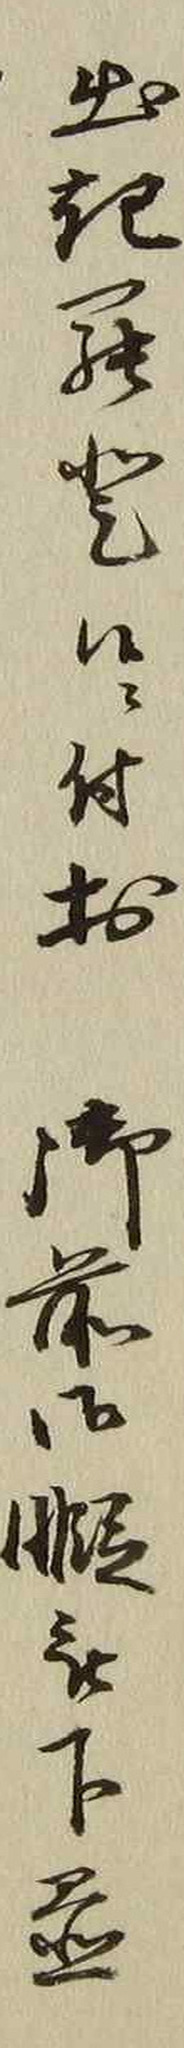出起罷登候に付於御前御暇被下置
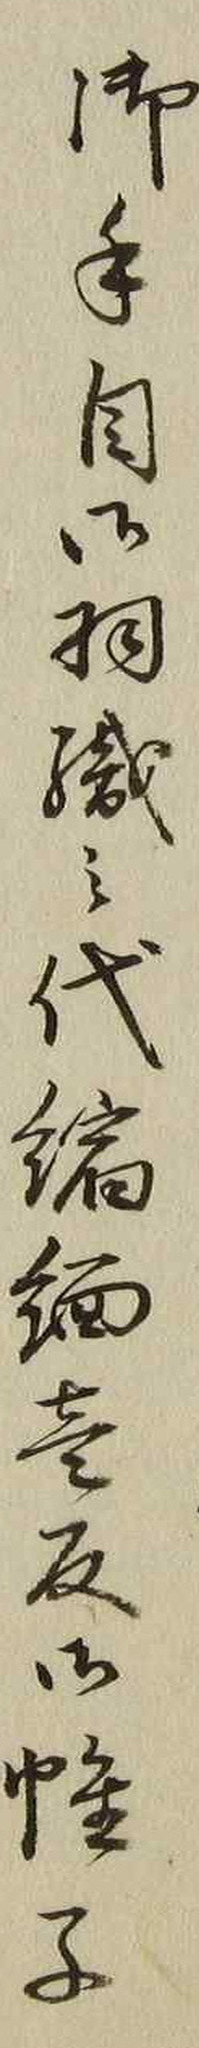御手自御羽織之代縮緬壱反御帷子
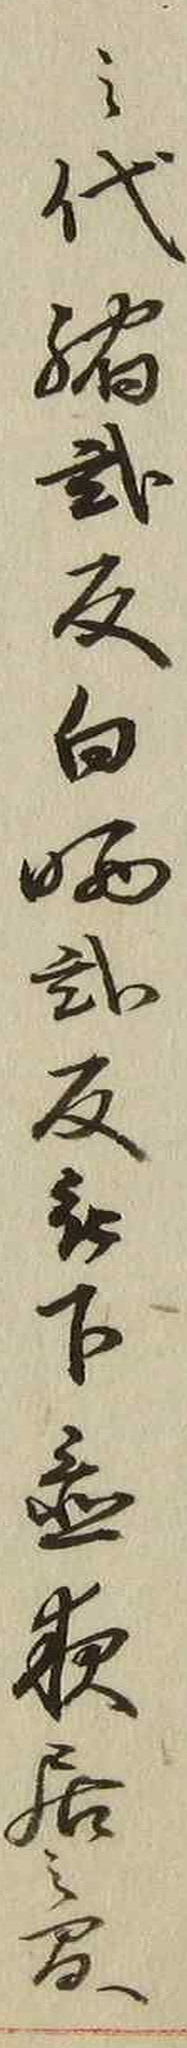之代縮弐反白晒弐反被下置夜居之間へ
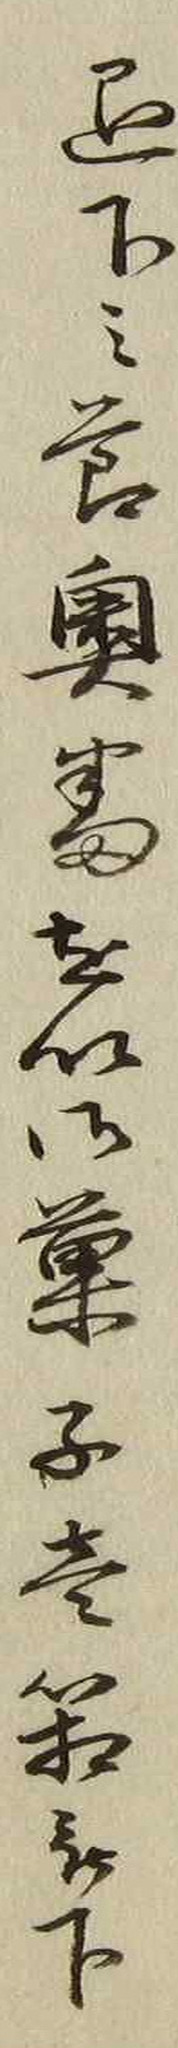退下之節奥番を以御菓子壱箱被下
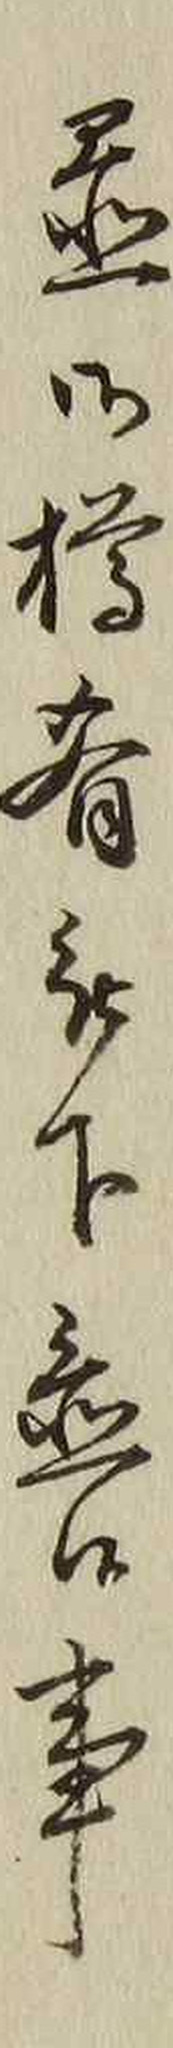置御樽肴被下置候事
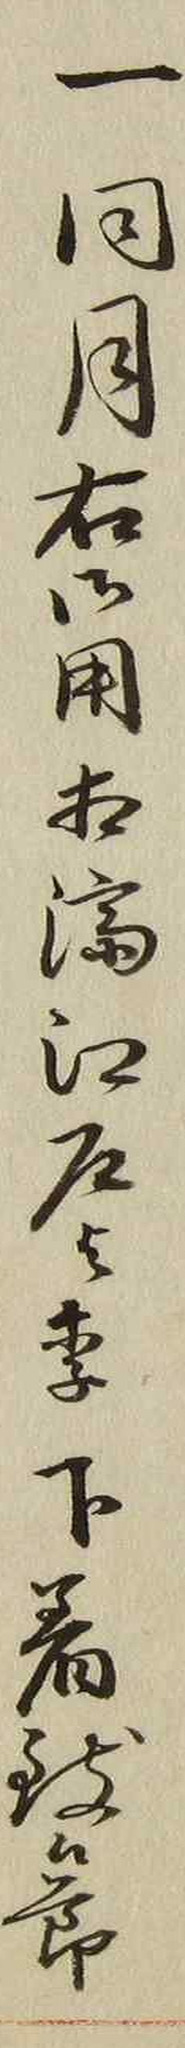一同月右御用相済江戸より下着致候節
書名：諸士系譜　巻之125　た之部1
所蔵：会津若松市立会津図書館
